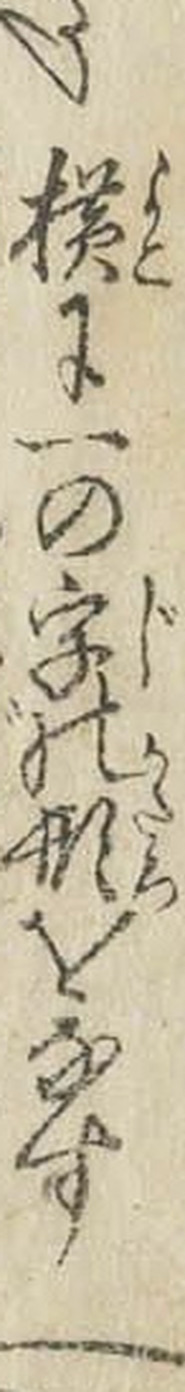横に一の字の形をなす
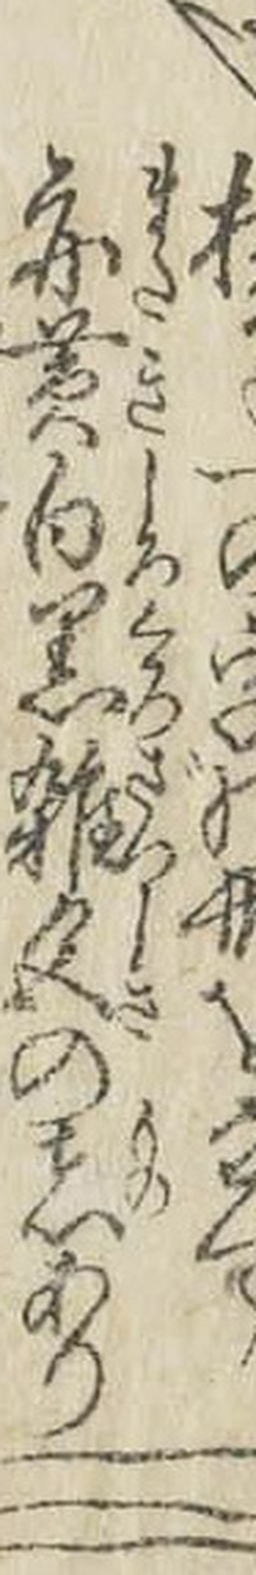亦黄白黒雑色の者あり
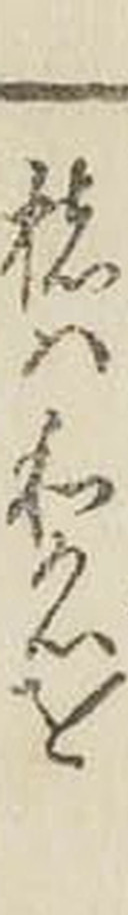楮は和名を
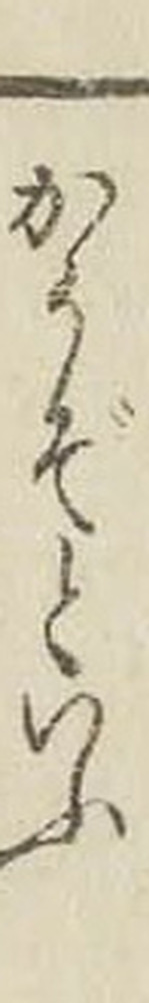かうぞといふ
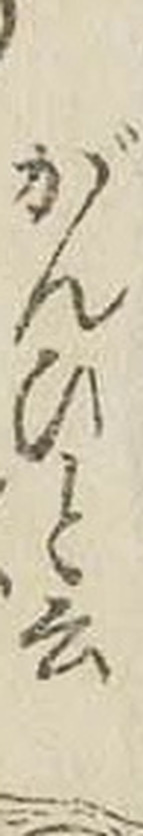がんひと云
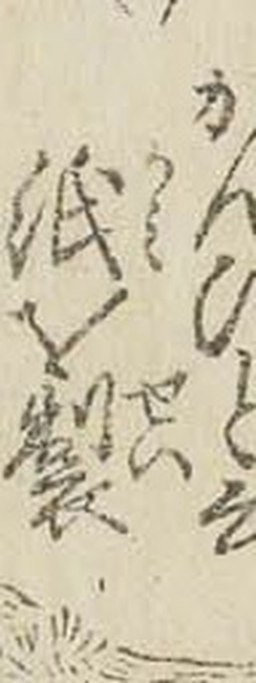紙を製

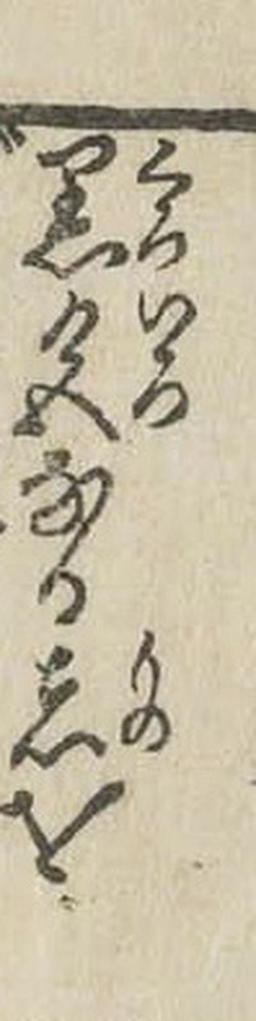黒色なる者を
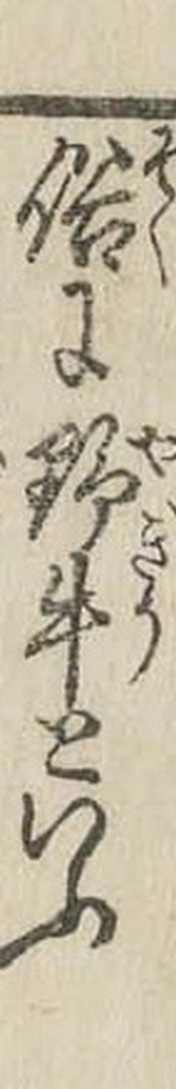俗に野牛といふ
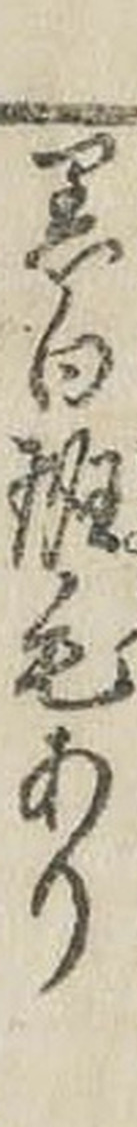黒白斑毛あり
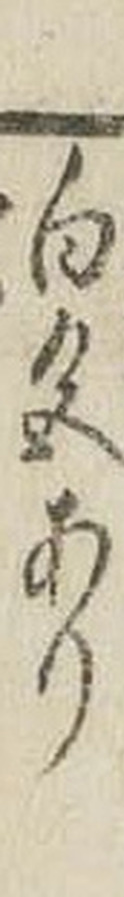白色あり
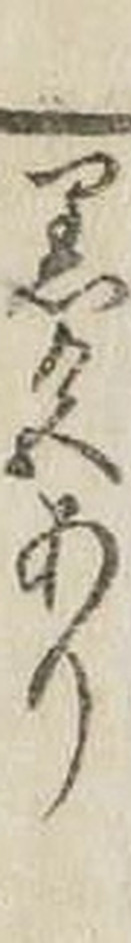黒色あり
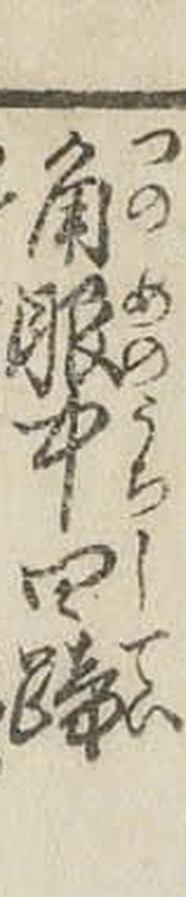角眼中四蹄
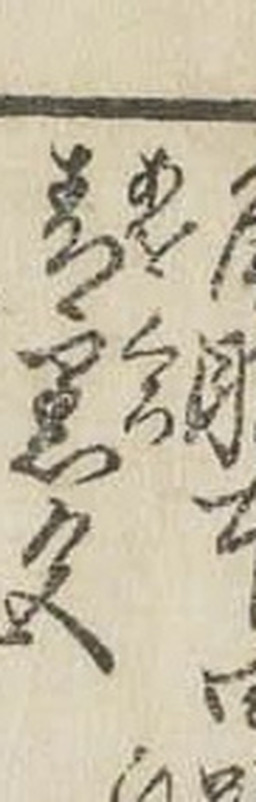青黒色
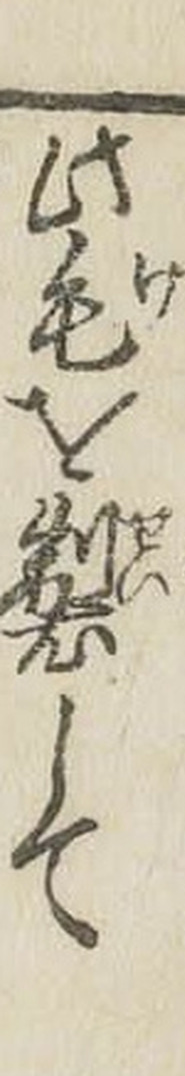此毛を製して
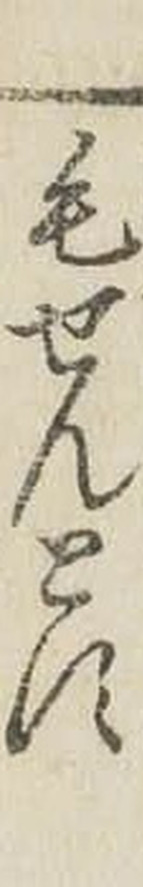毛せんとす
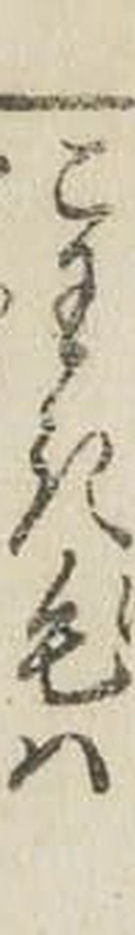こわき毛は
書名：絵本写宝袋 9巻 9之巻下
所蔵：東京学芸大学教育コンテンツアーカイブ
